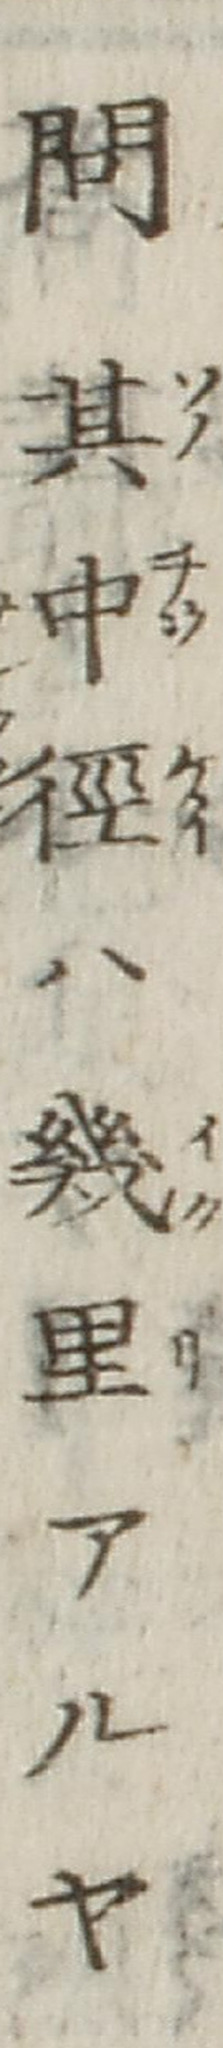問其中径ハ幾里アルヤ
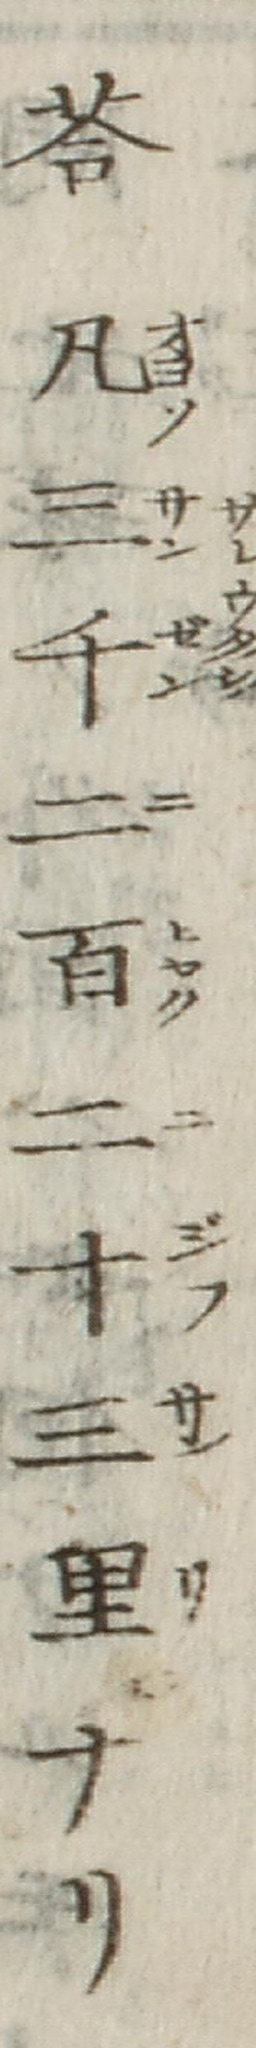答凡三千二百二十三里ナリ
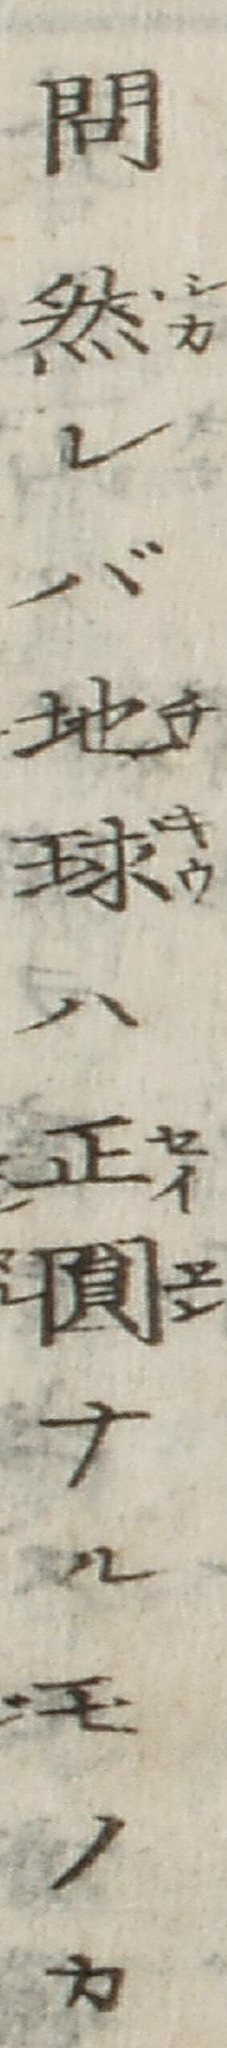問然レバ地球ハ正円ナルモノカ
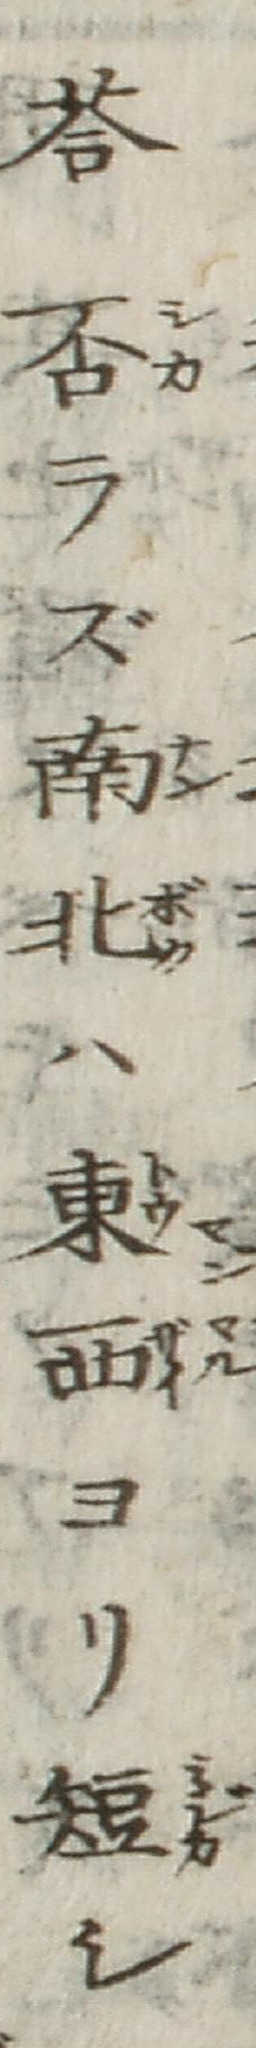答否ラズ南北ハ東西ヨリ短シ
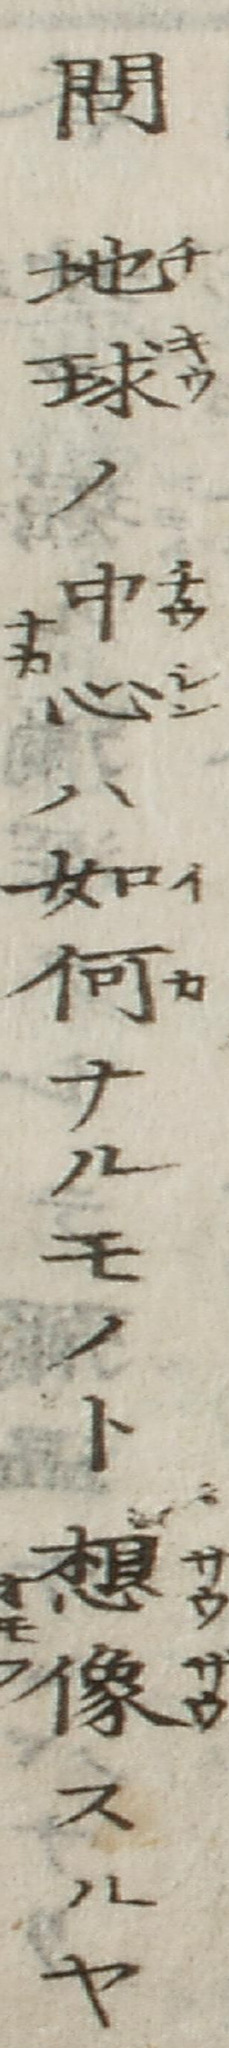問地球ノ中心ハ如何ナルモノト想像スルヤ
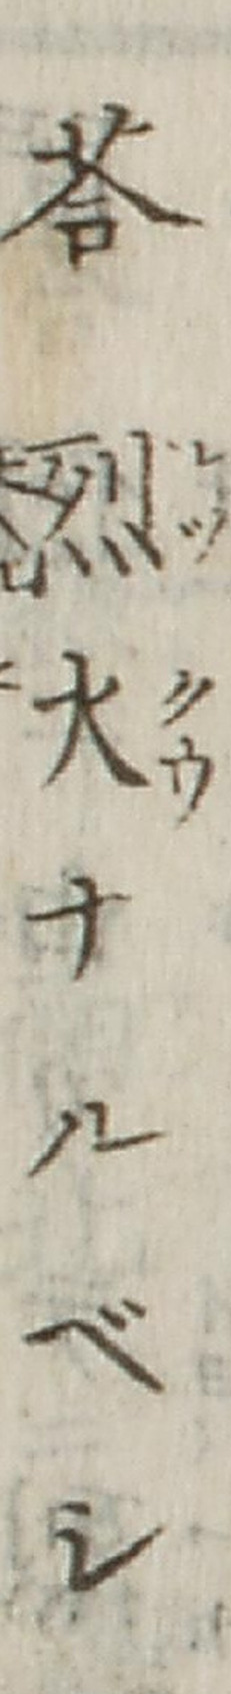答烈火ナルベシ

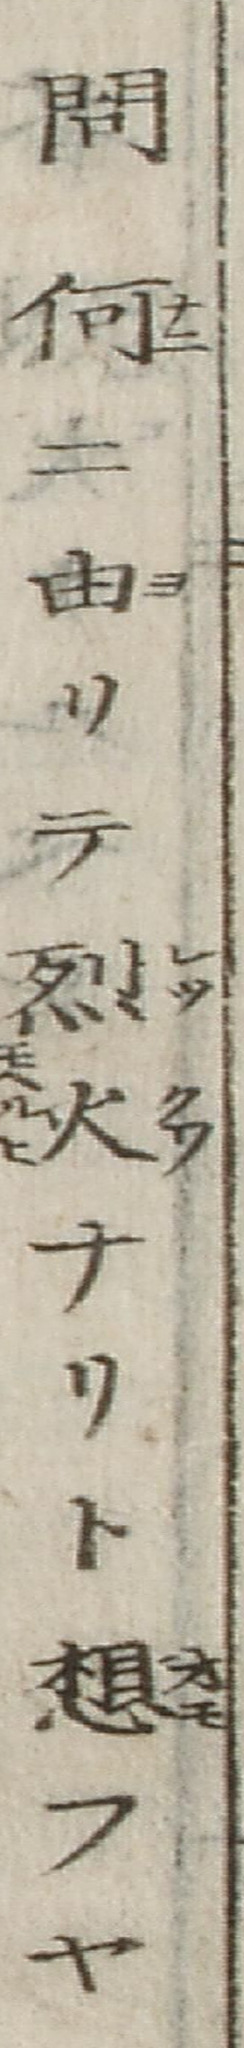問何ニ由リテ烈火ナリト想フヤ
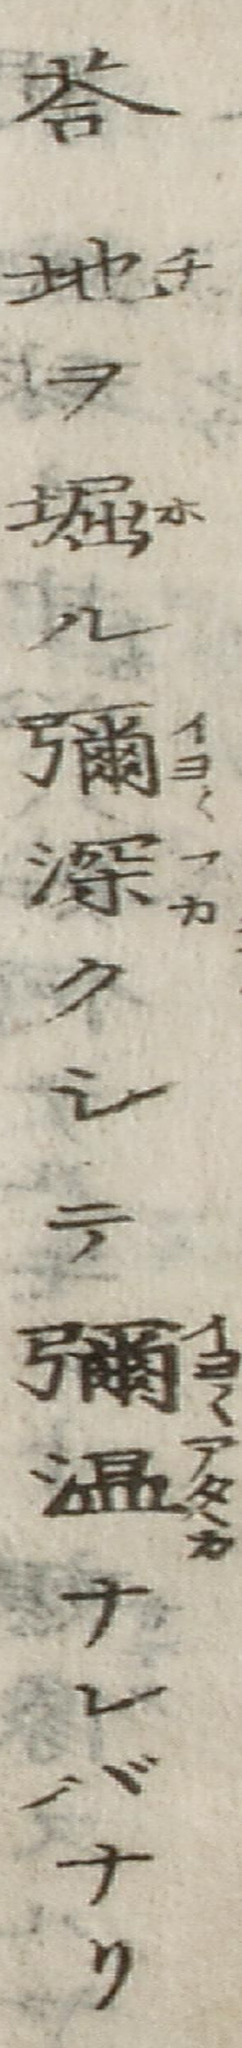答地ヲ堀ル彌深クシテ彌温ナレバナリ
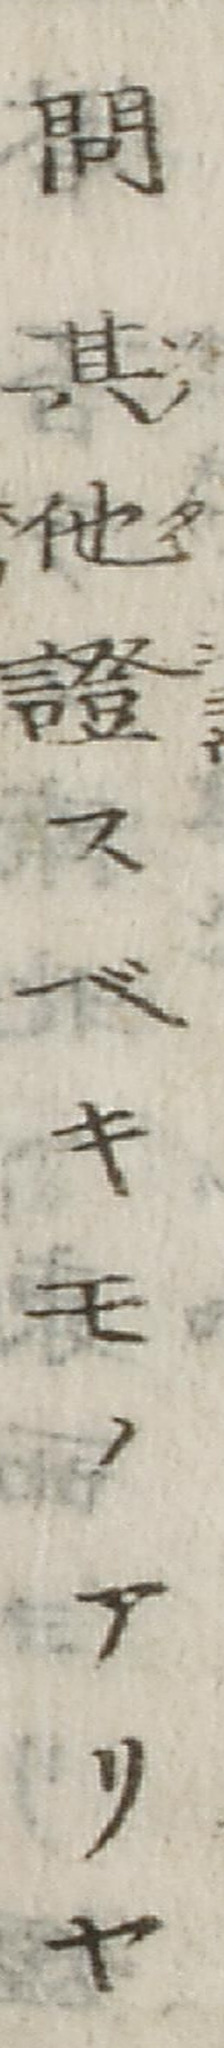問其他証スベキモノアリヤ
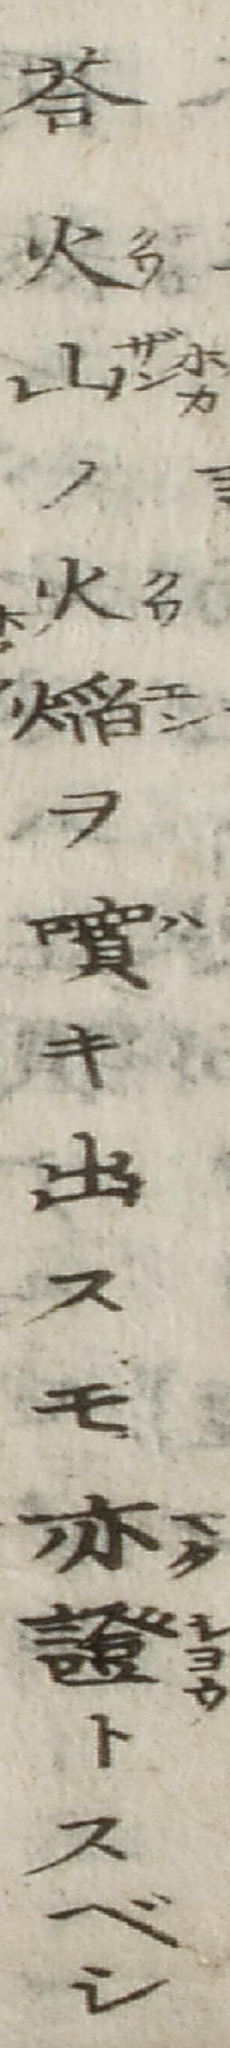答火山ノ火焔ヲ噴キ出スモ亦証トスベシ
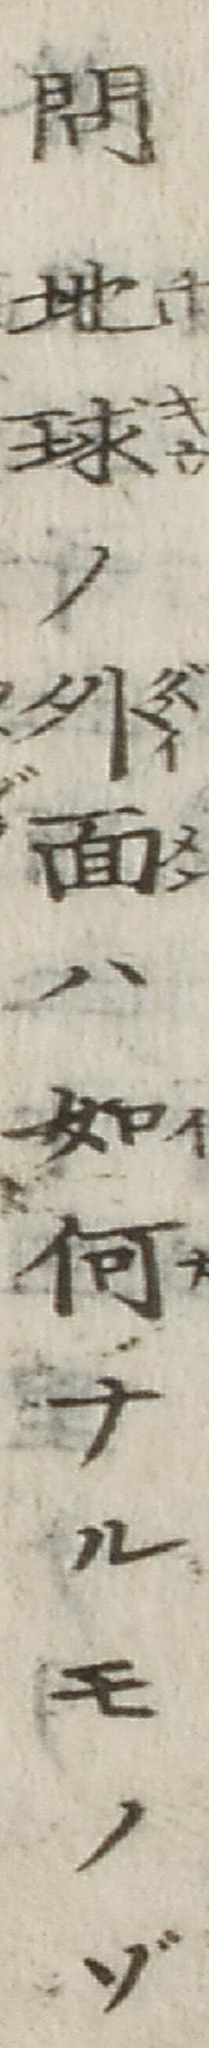問地球ノ外面ハ如何ナルモノゾ
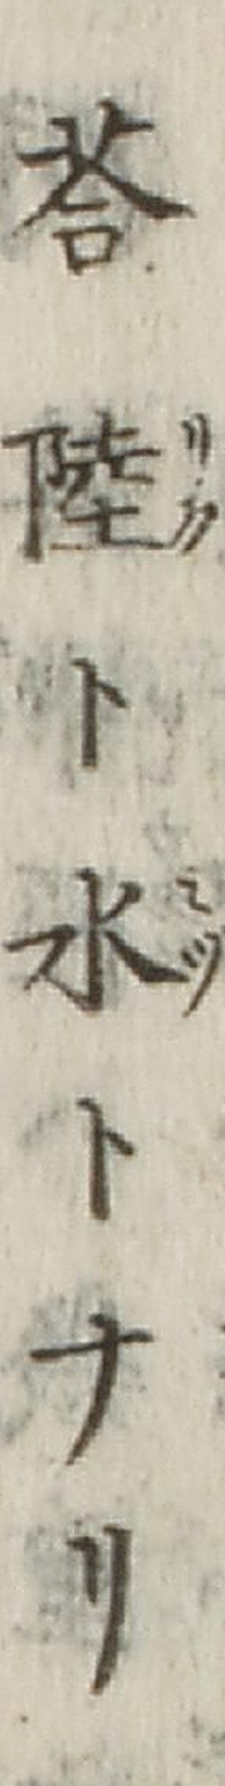答陸ト水トナリ
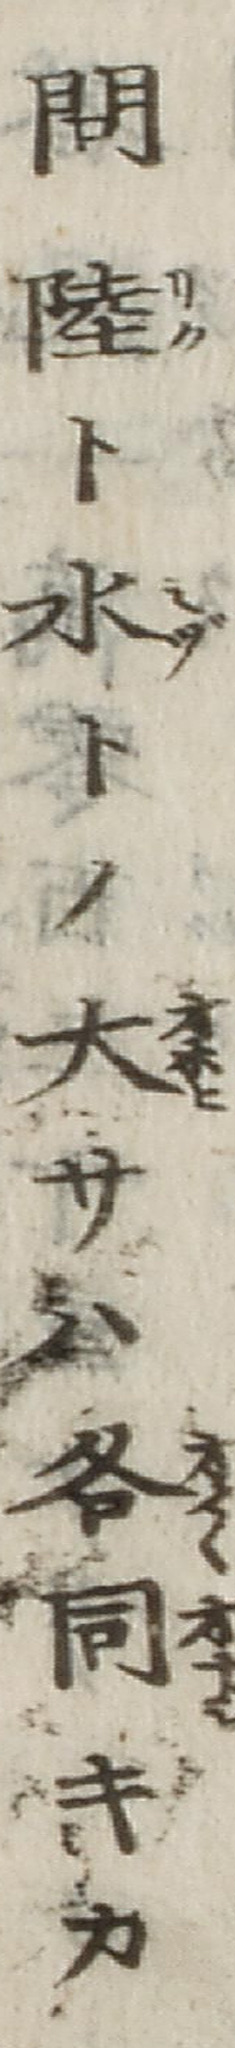問陸ト水トノ大サハ各同キカ
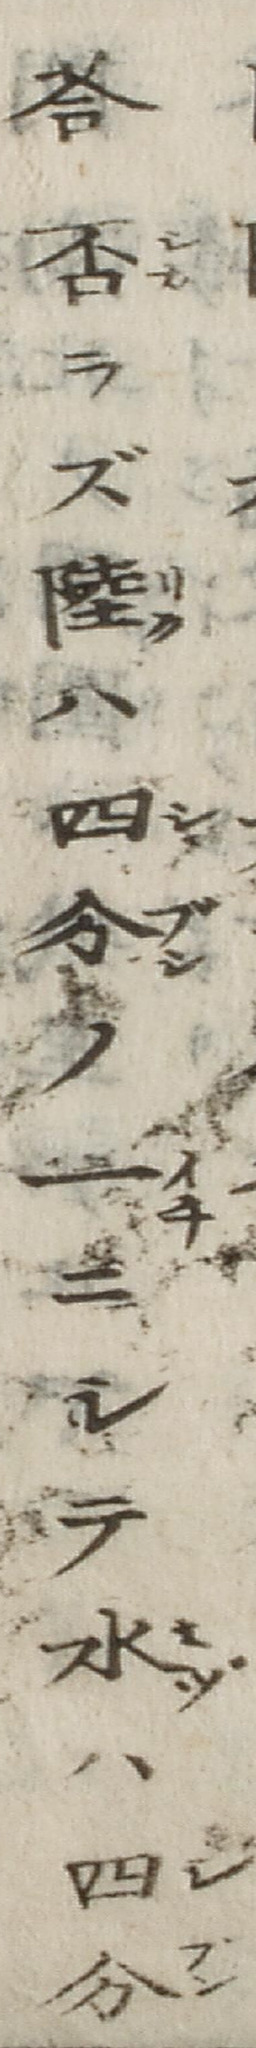答否ラズ陸ハ四分ノ一ニシテ水ハ四分
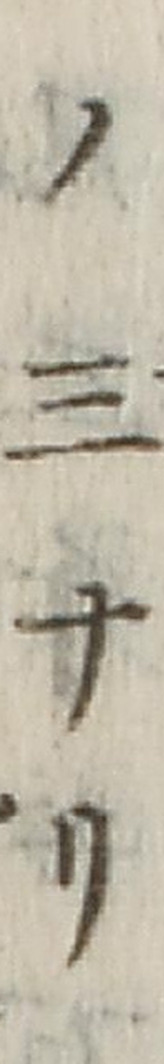ノ三ナリ
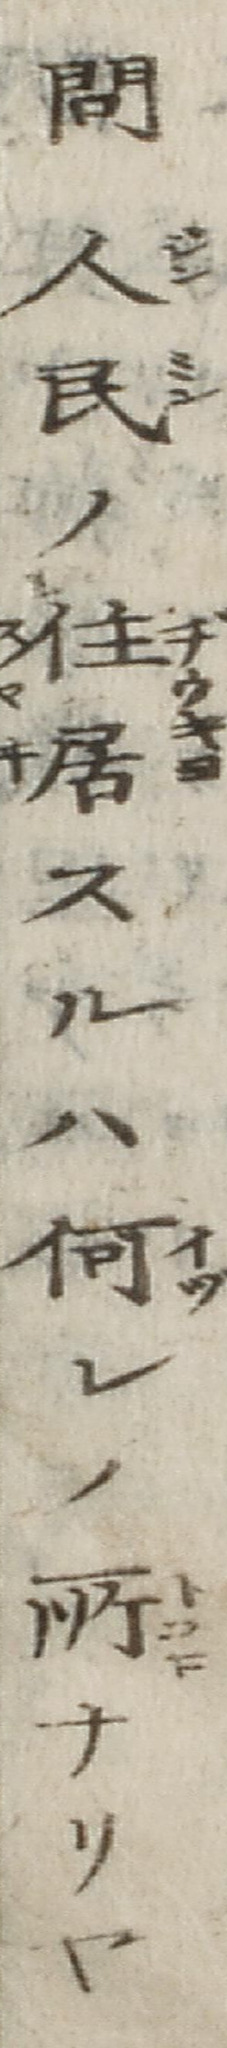問人民ノ住居スルハ何レノ所ナリヤ
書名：地球儀問答　全
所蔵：東京大学地震研究所図書室 Earthquake Research Institute Library, The University of Tokyo, JAPAN
